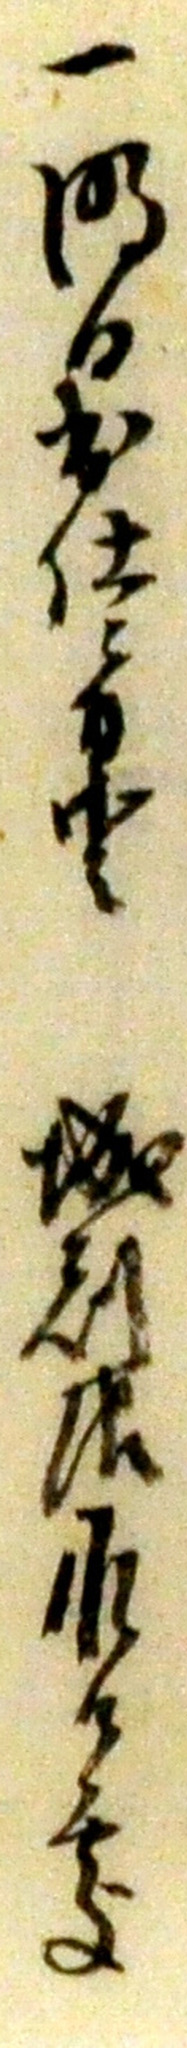一明日出仕ニ付登城刻限承候処
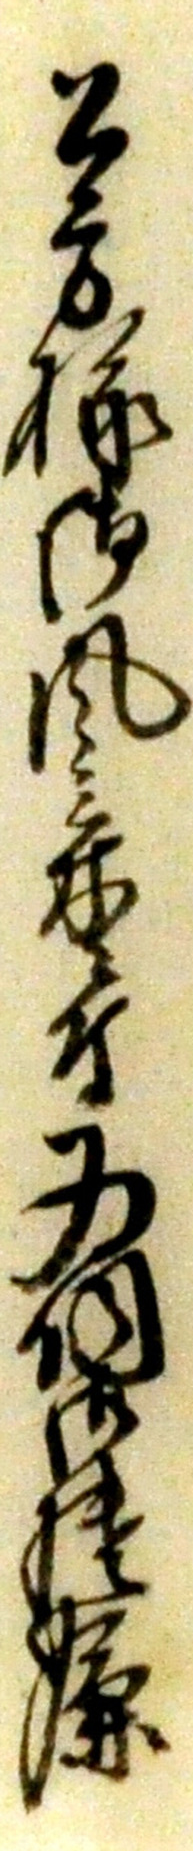公方様御風気ニ付為伺御機嫌
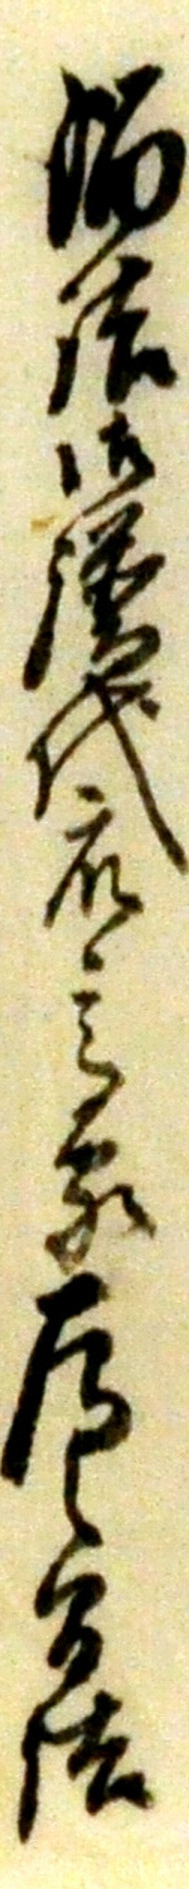溜詰御譜代衆之家鳫之間御詰
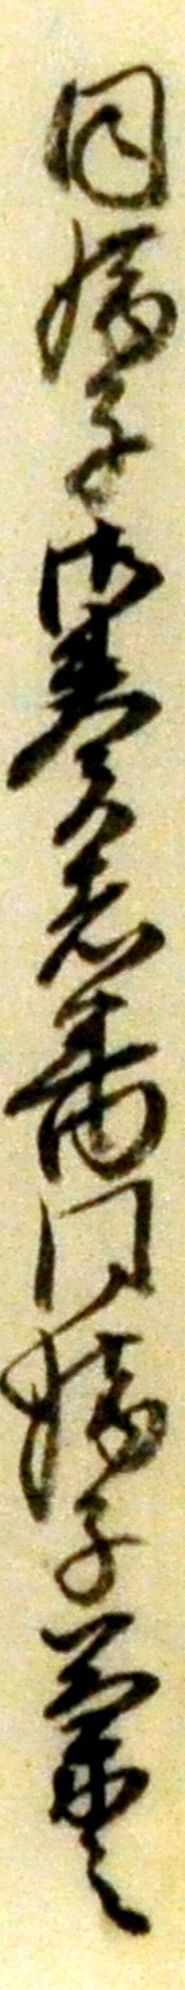同嫡子御奏者番同嫡子菊之
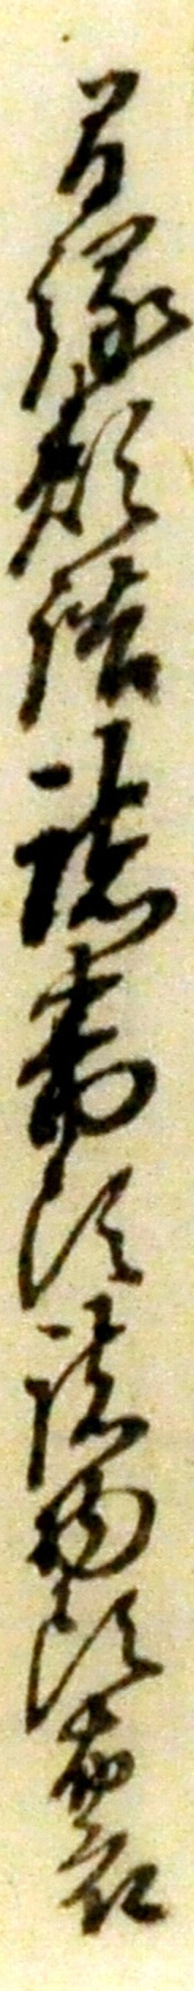間縁頬詰諸番頭諸物頭布衣
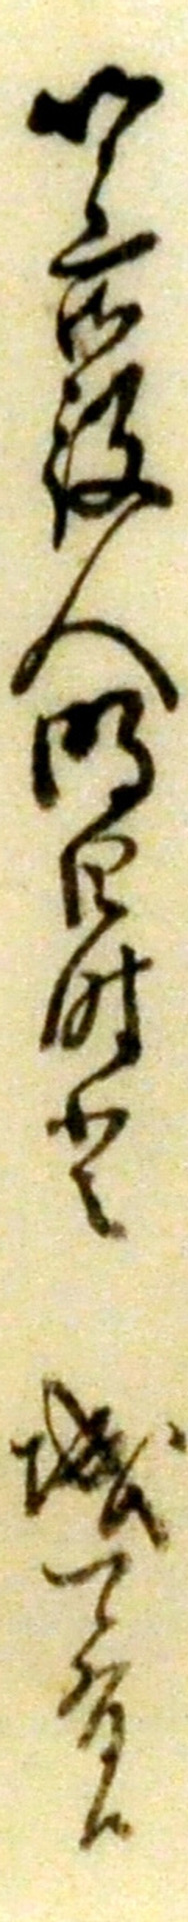以上御役人明四時登城可有候
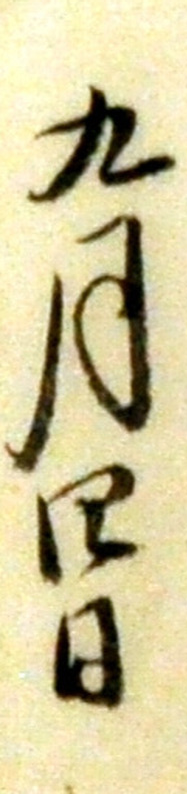九月四日

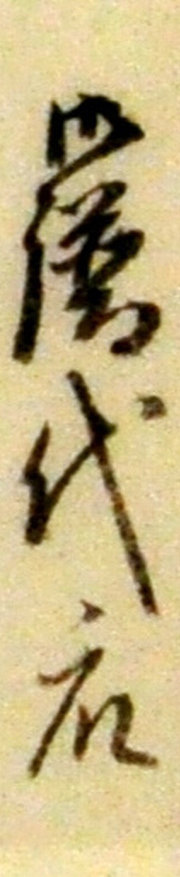御譜代衆
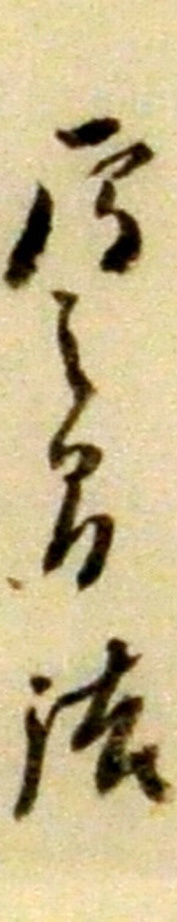鳫之間詰
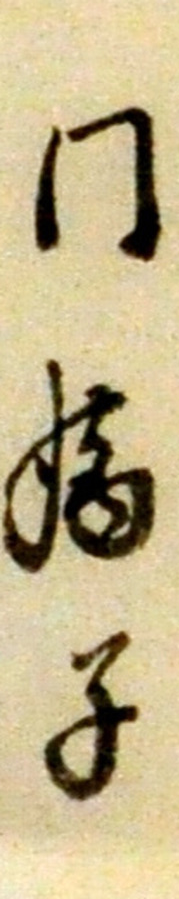同嫡子
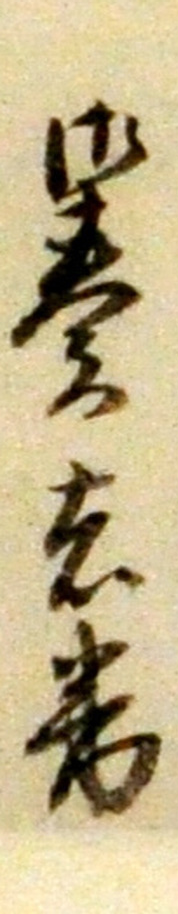御奏者番
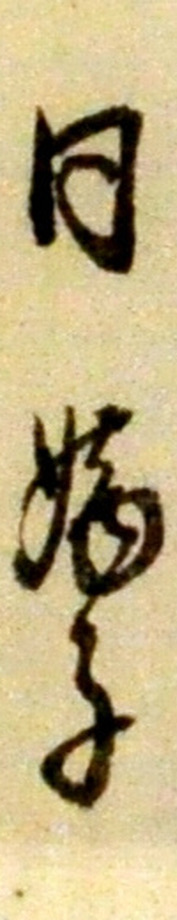同嫡子
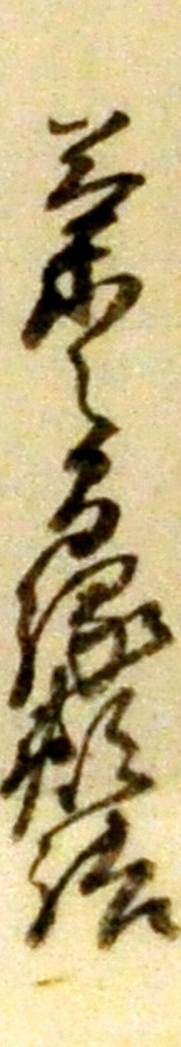菊之間縁類詰
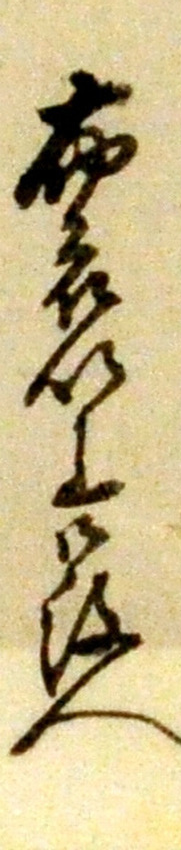布衣以上御役人
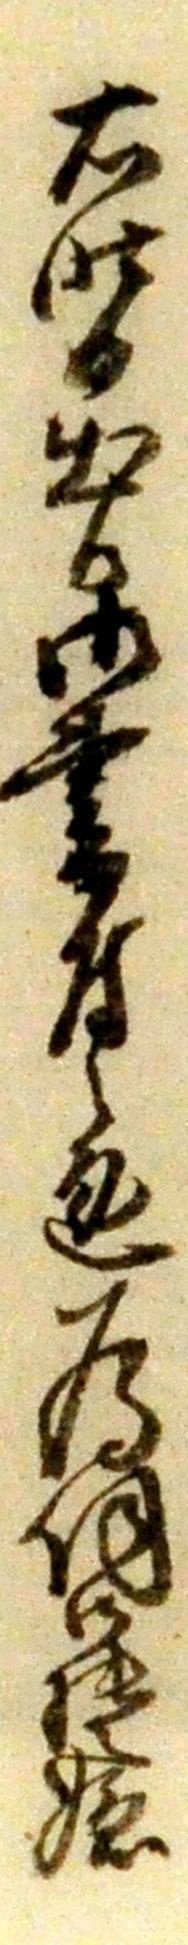右昨日出候御書付之通為伺御機嫌
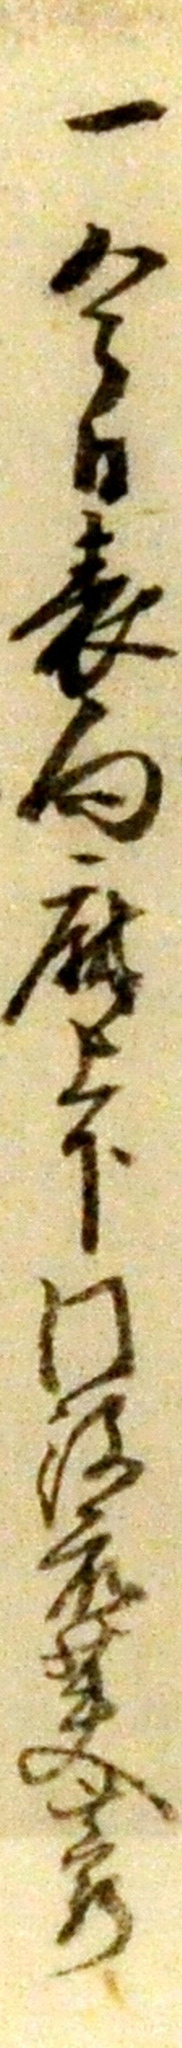一今日表向麻上下同役衆芙蓉
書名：書抜
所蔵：伊那市立高遠町図書館・合同会社AMANE
